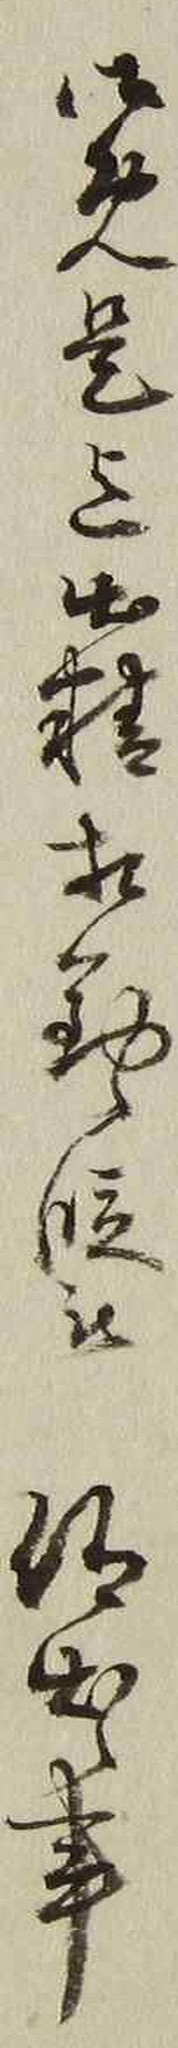御免是迄出精相勤候段被仰出候事
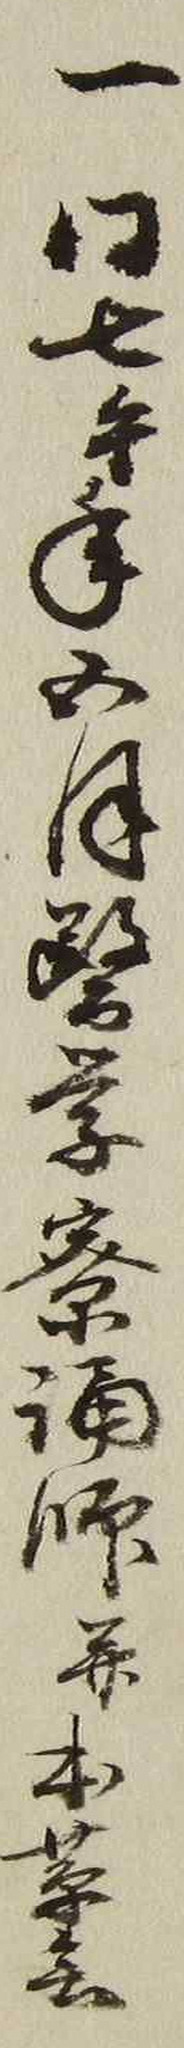一同七午年五月医学寮誦師并本草会
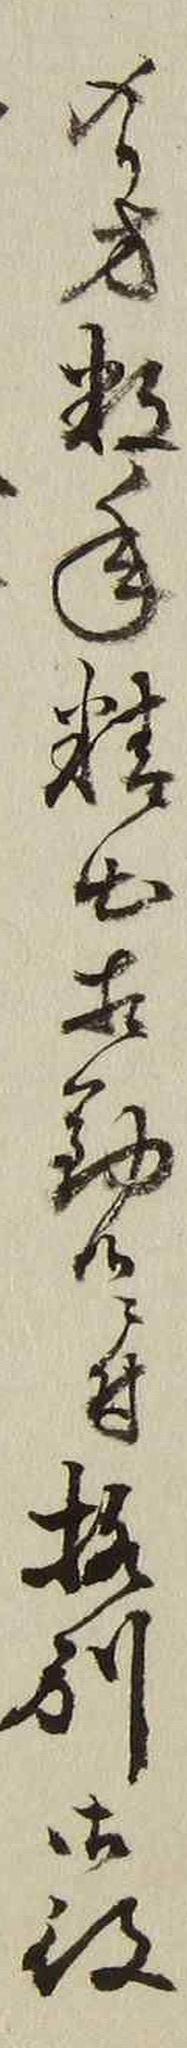〆り方数年精出相勤候ニ付格別御役
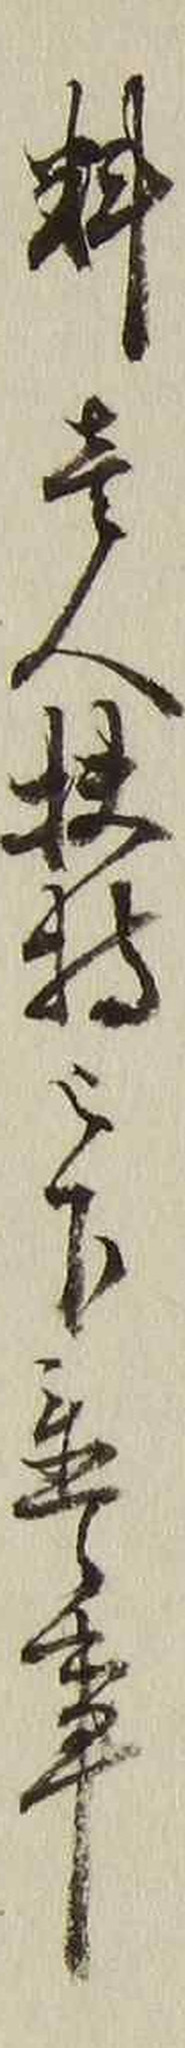料壱人扶持被下置候事
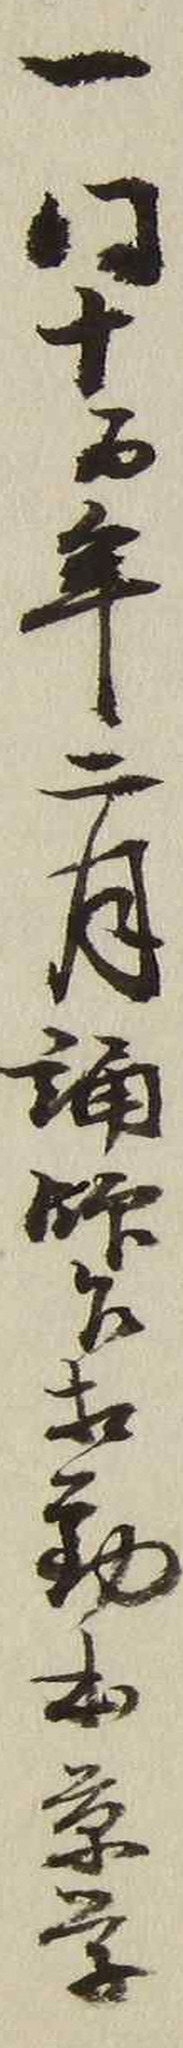一同十酉年二月誦師乍相勤本草学

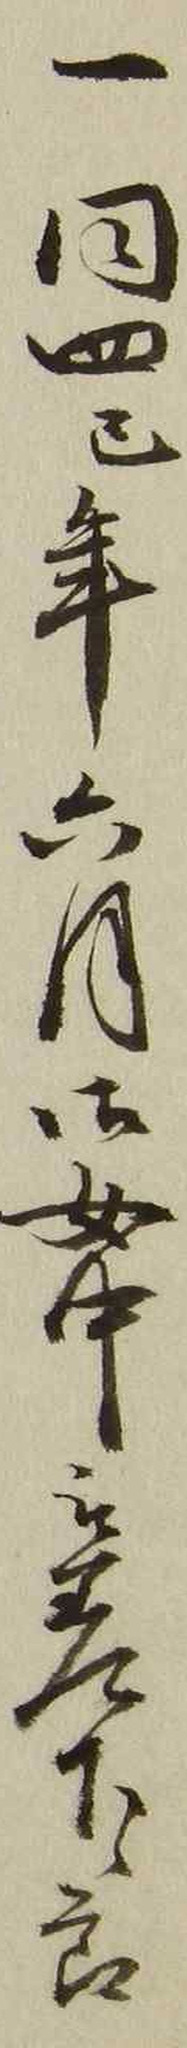一同四巳年六月御女中被差下候節
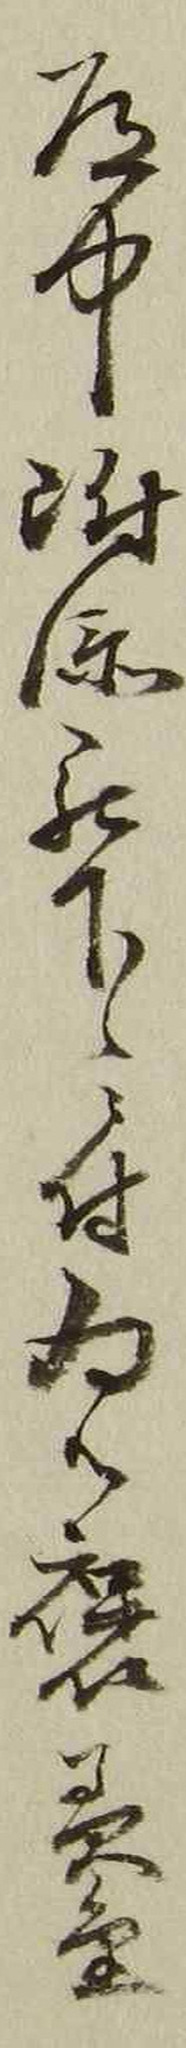道中附添罷下候ニ付為御褒美金
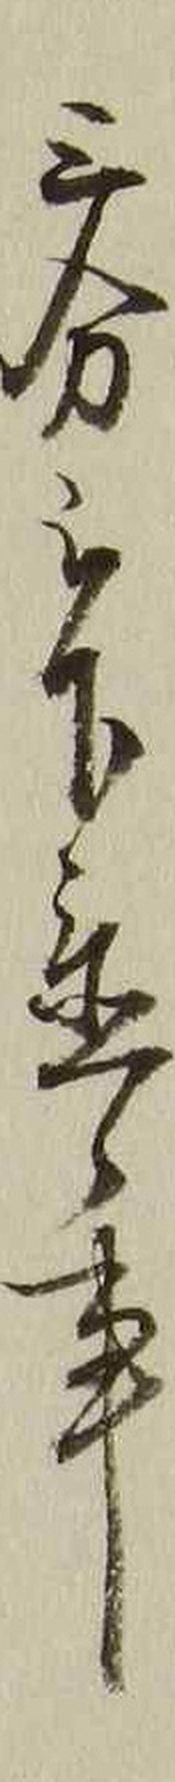三分被下置候事
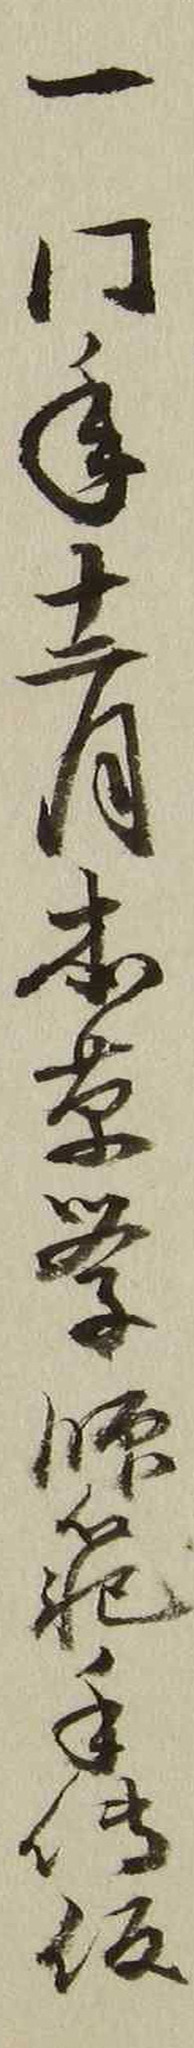一同年十二月本草学師範手伝仮
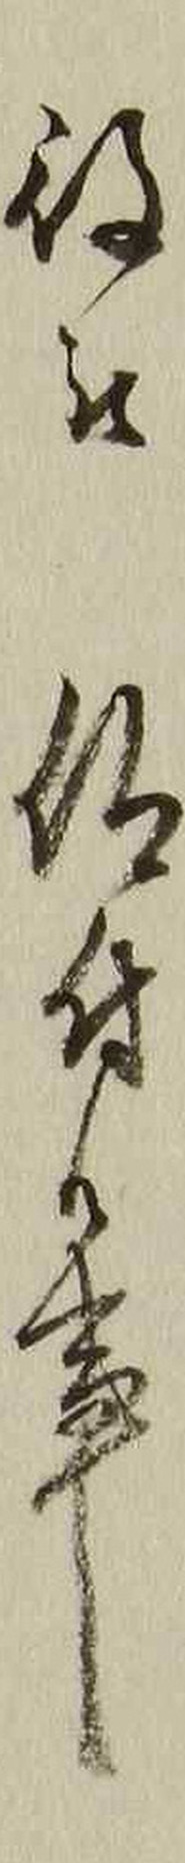役被仰付候事
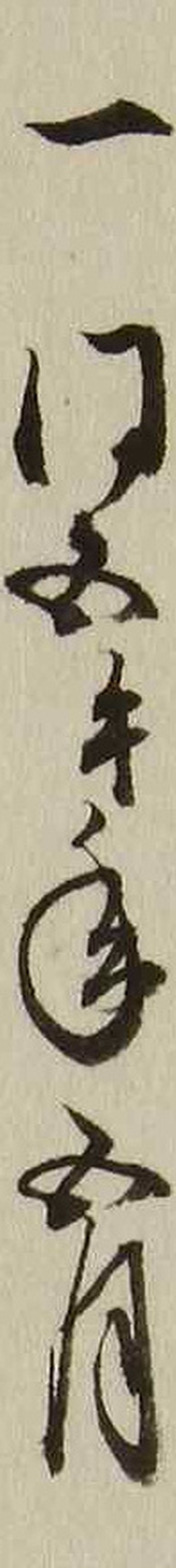一同五午年五月
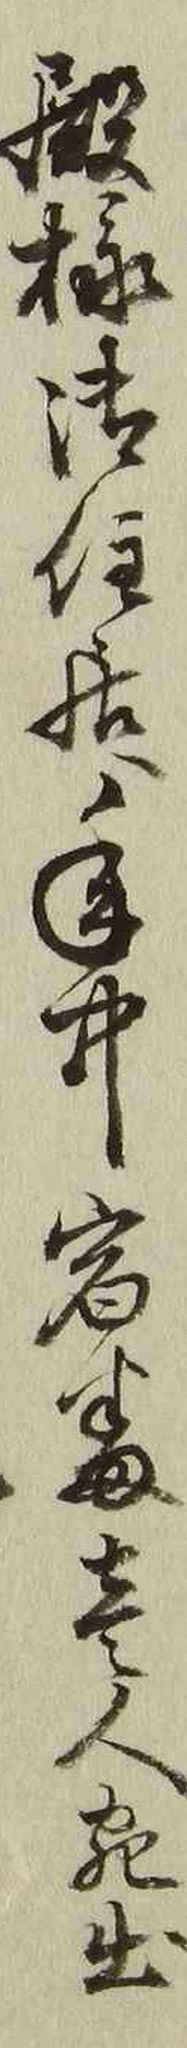殿様御住居へ年中宿番壱人宛出
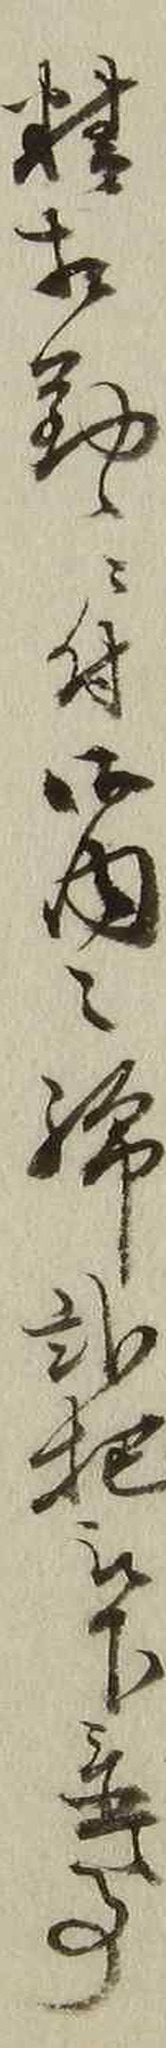精相勤候ニ付御内々綿弐把被下置候事
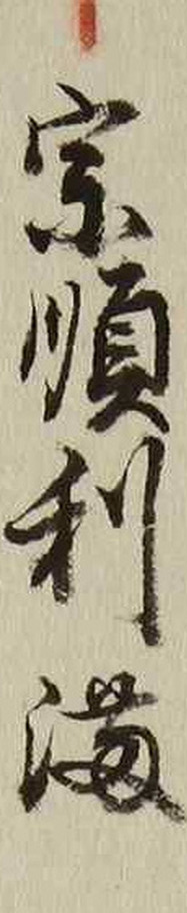宗順利満
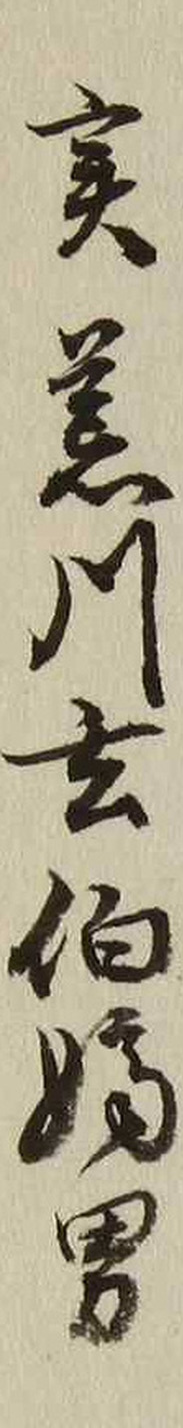実荒川玄伯嫡男
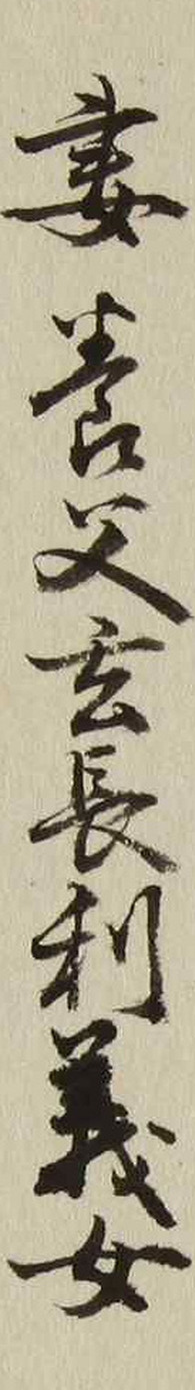妻養父玄長利義女
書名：諸士系譜　巻之39　は之部7
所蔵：会津若松市立会津図書館
